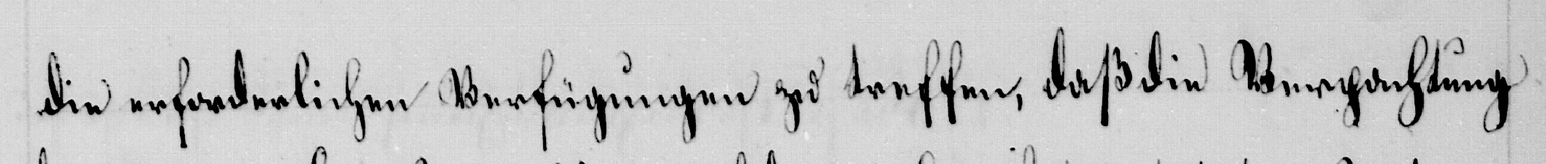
die erforderlichen Verfügungen zu treffen, daß die Verpachtung
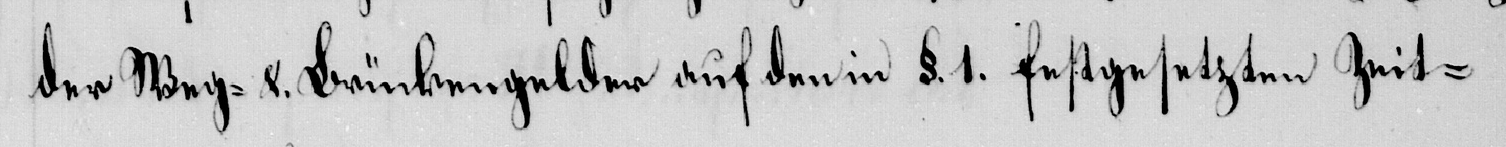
der Weg- &. Brückengelder auf den in §. 1. festgesetzten Zeit¬
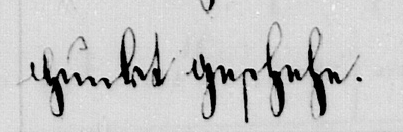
punkt geschehe.
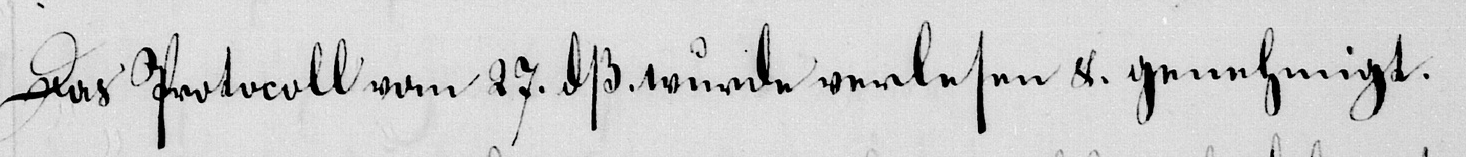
Das Protocoll vom 27. dß. wurde verlesen &. genehmigt.
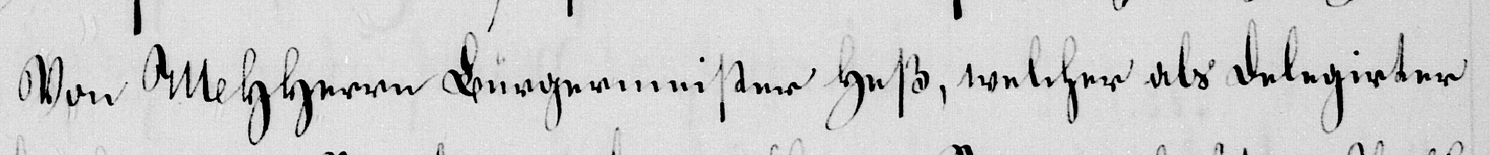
Von MHHerrn Bürgermeister Heß, welcher als Delegirter
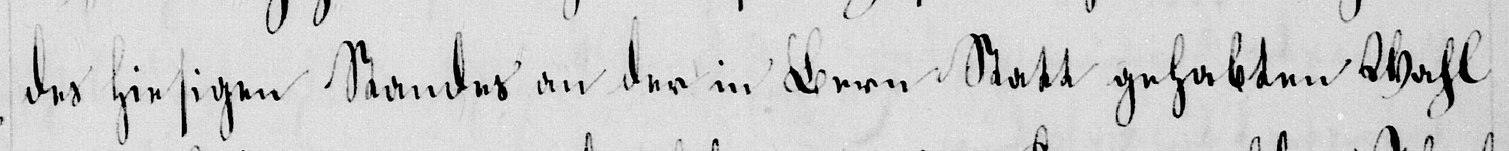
des hiesigen Standes an der in Bern Statt gehabten Wahl
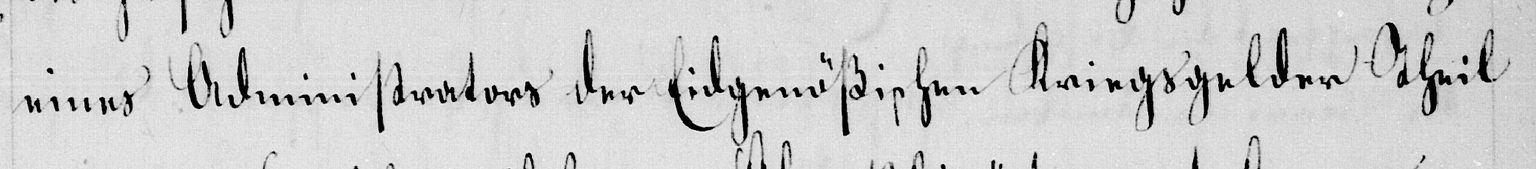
eines Administrators der Eidgenößischen Kriegsgelder Theil
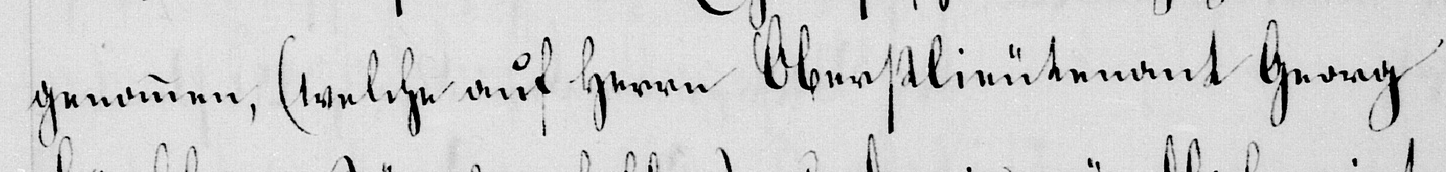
genommen, (welche auf Herrn Oberstlieutenant Georg
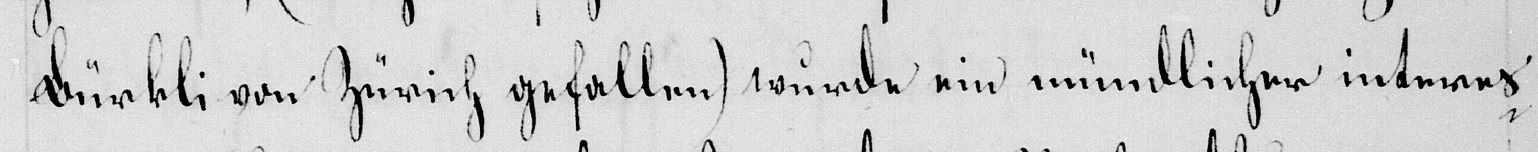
Bürkli von Zürich gefallen) wurde ein mündlicher intereß¬
